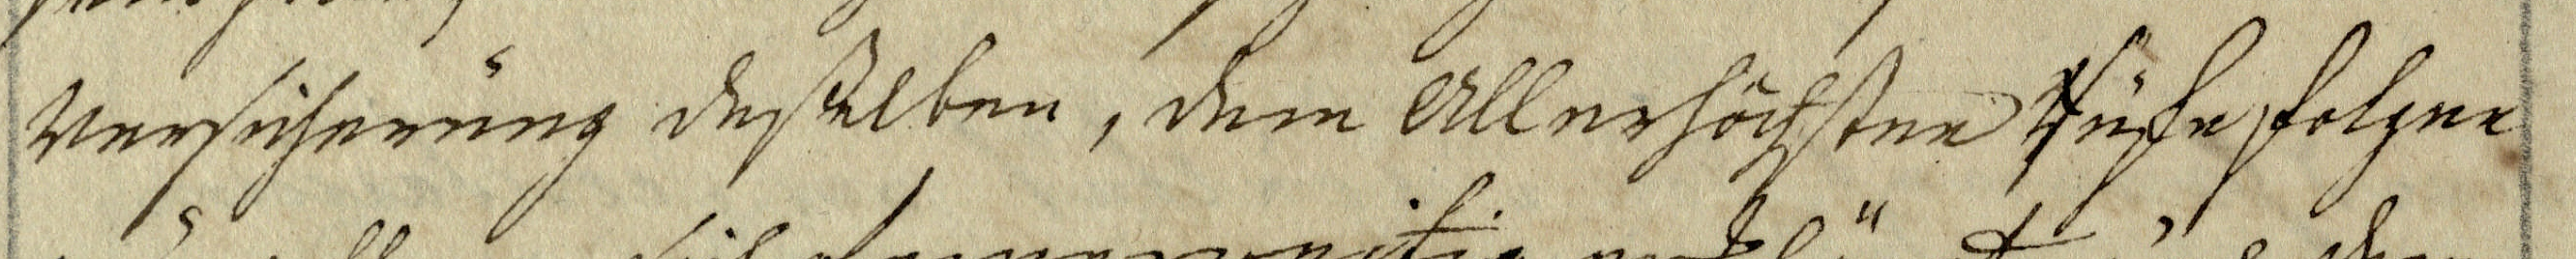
Versicherung deßelben, dem Allerhöchsten Rufe folgen
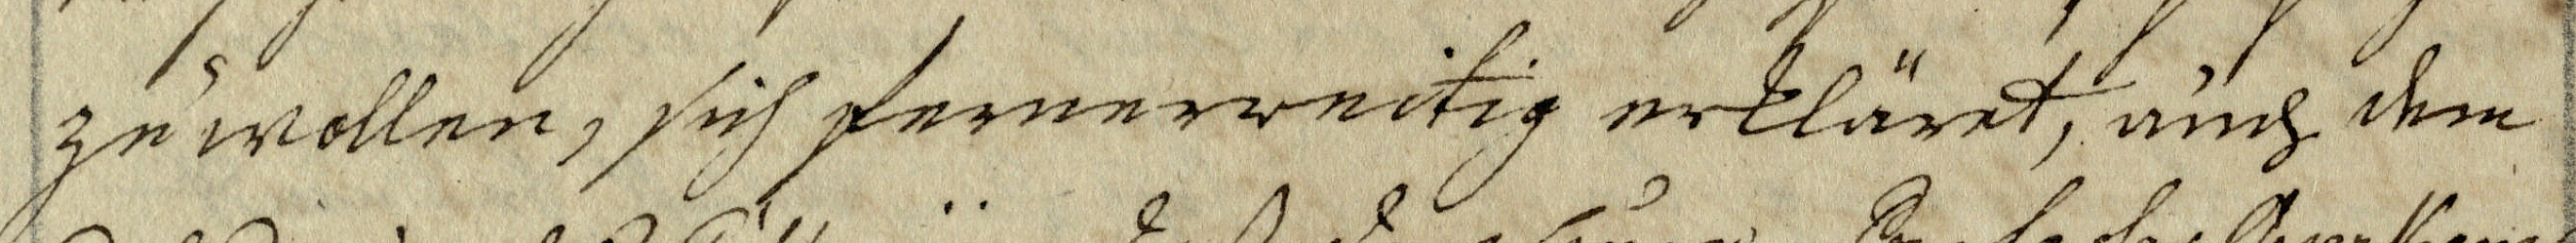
zu wollen, sich fernerweitig erkläret, auch dem
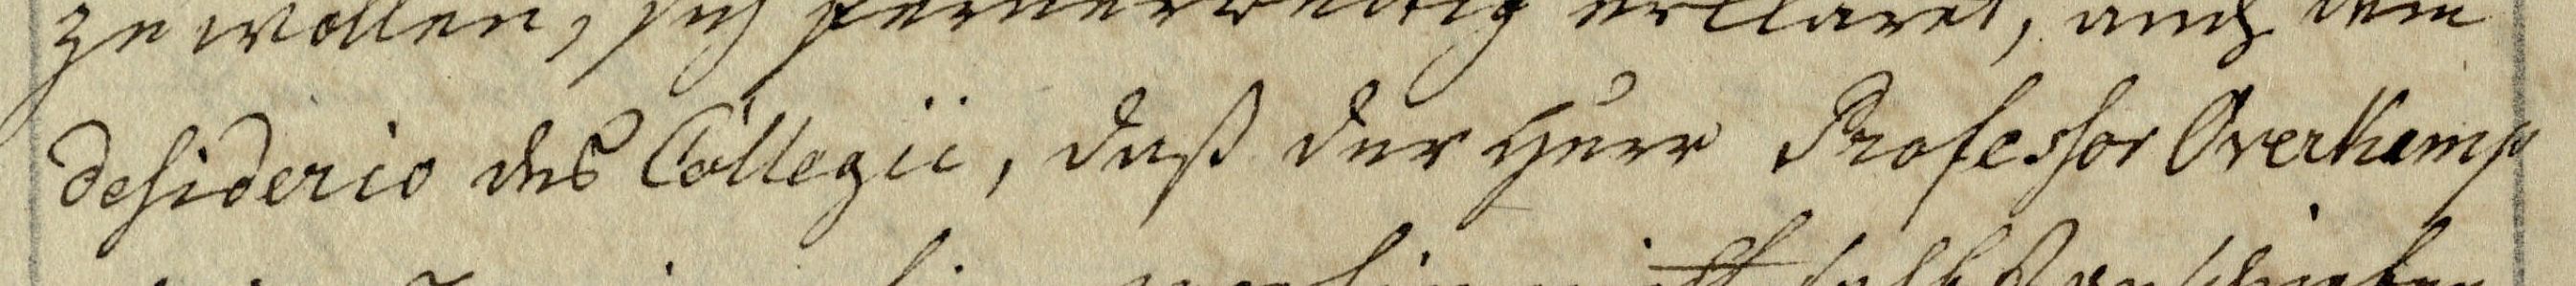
desiderio des Collegii, daß der Herr Professor Overkamp
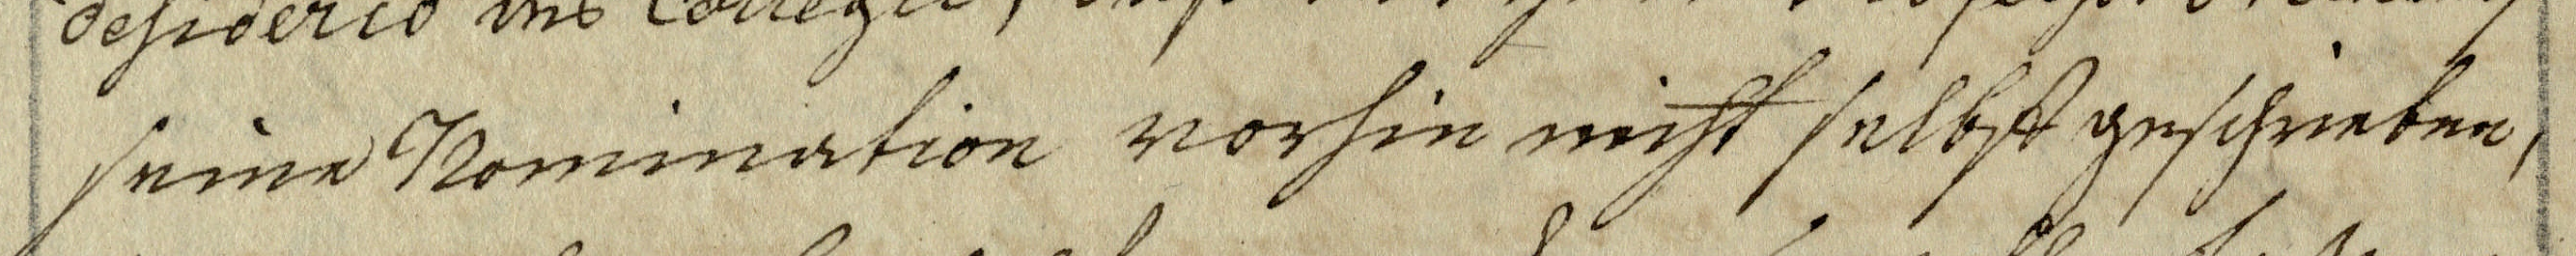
seine Nomination vorhin nicht selbst geschrieben,
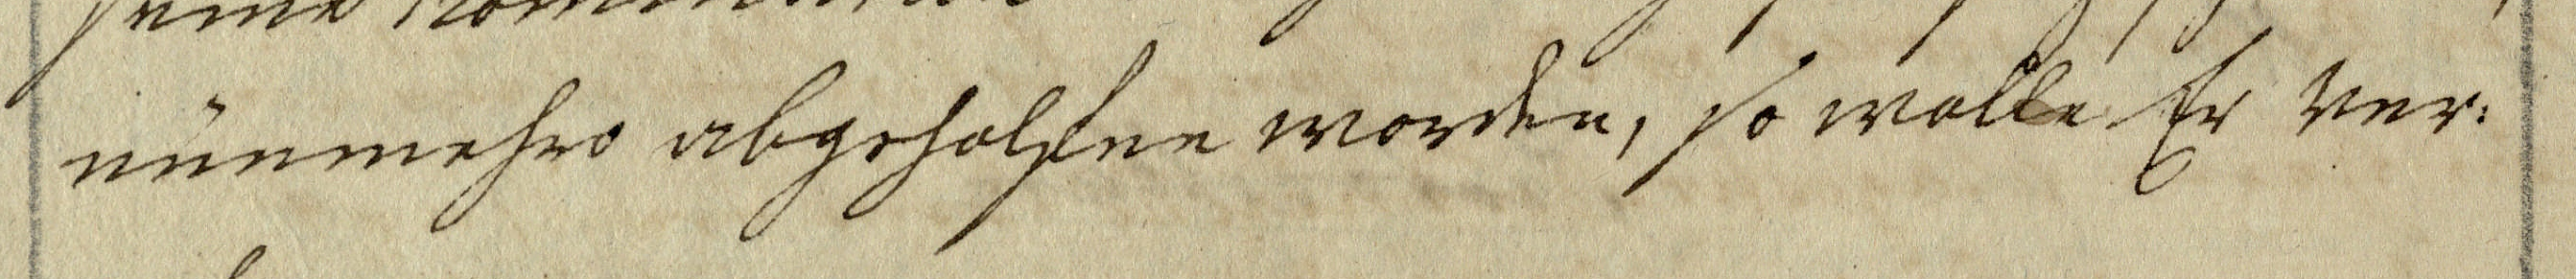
nunmehro abgeholfen worden, so wolle Er ver¬
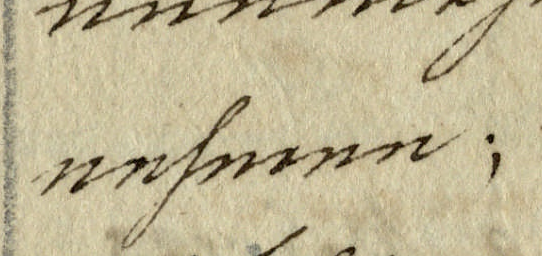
nehmen:
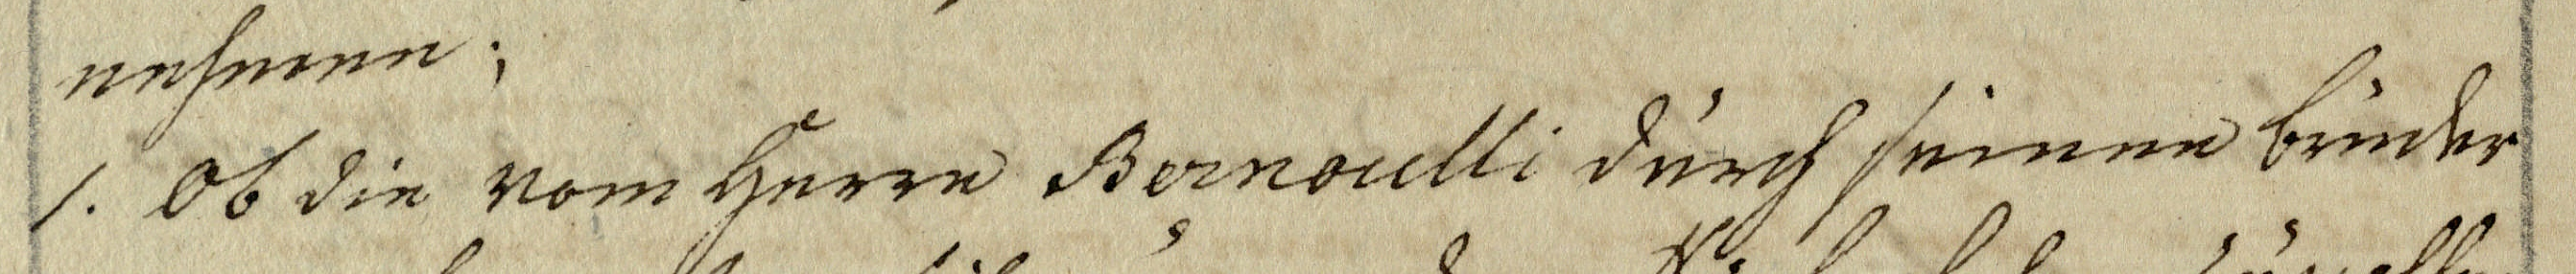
1. Ob die vom Herrn Bernoulli durch seinen Bruder
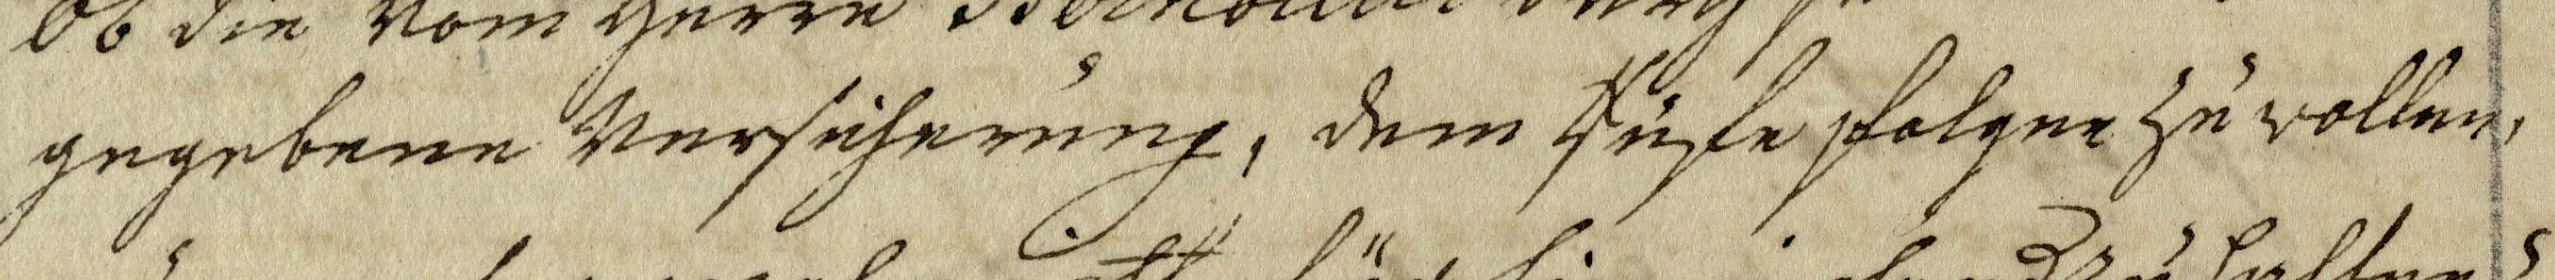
gegebene Versicherung, dem Rufe folgen zu wollen,
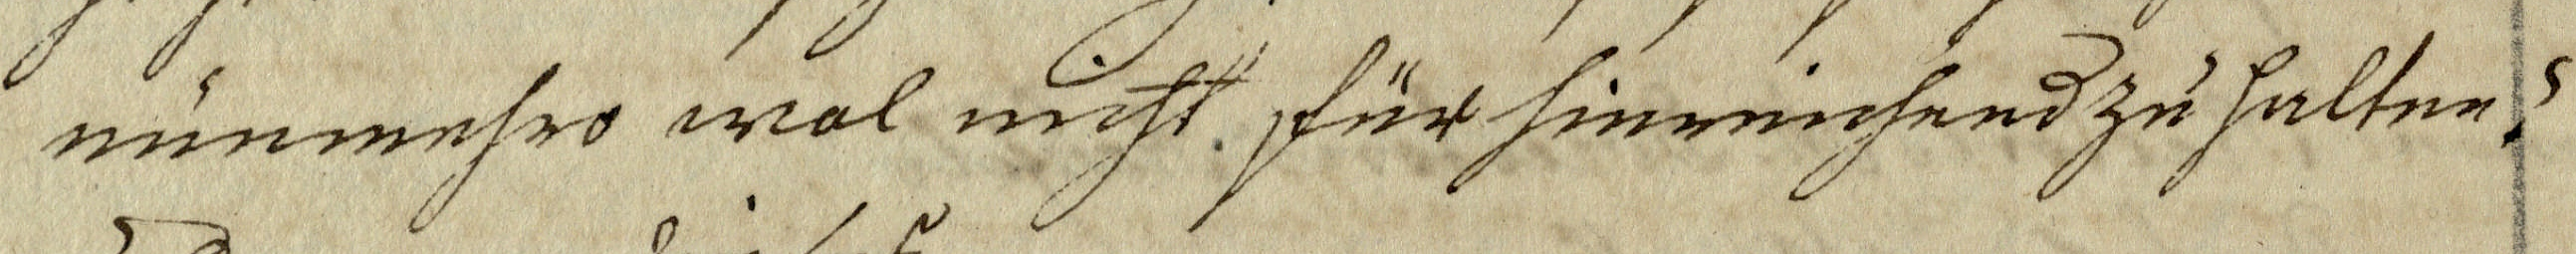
nunmehro wohl nicht für hinreichend zu halten?
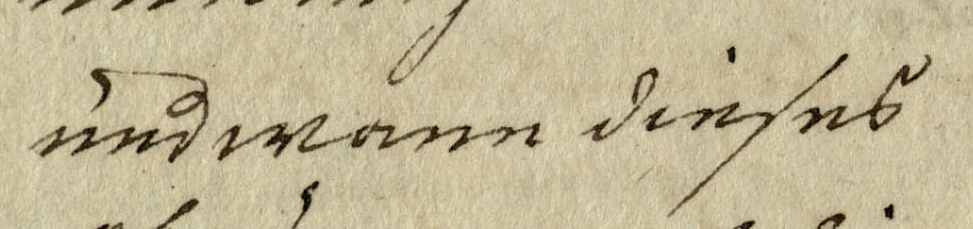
und wann dieses
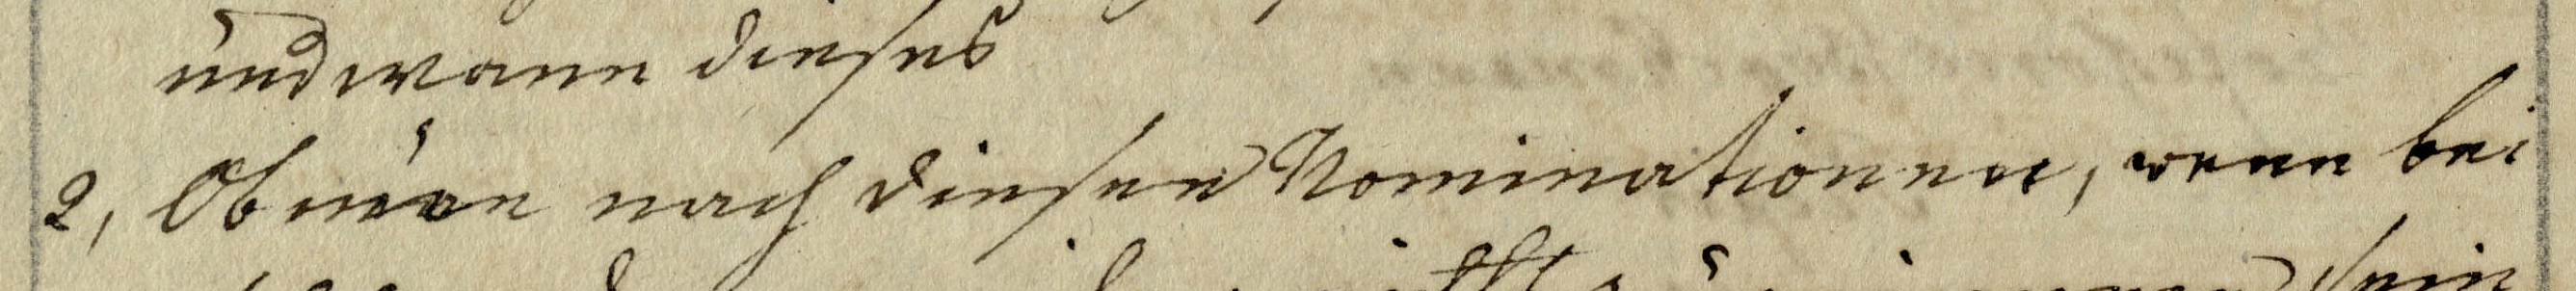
2, Ob nun nach diesen Nominationen, wenn bei
